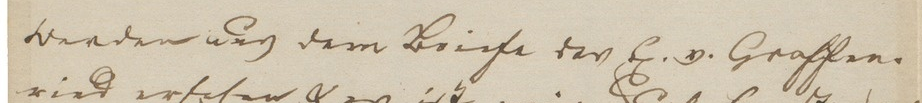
werden aus dem Briefe des Herrn. v. Graffen-
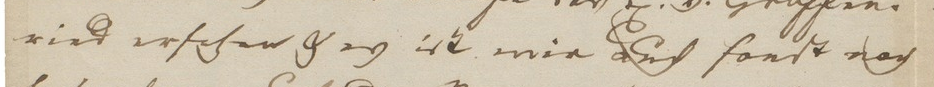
ried ersehen & es ist mir auch sonst noch
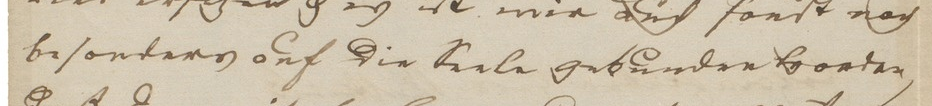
besonders auf die Seele gebunden worden,
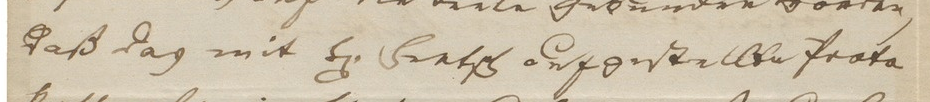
daß das mit H. Hentsch aufgestellte Proto-
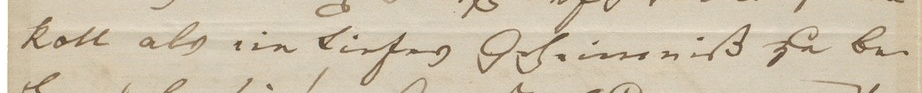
koll als ein tiefes Geheimniß zu be-
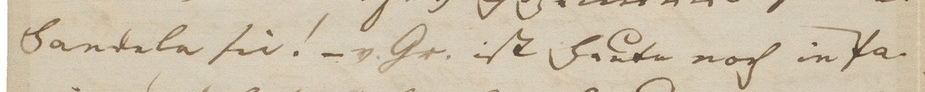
handeln sei! – v. Gr. ist heute noch in Pa-
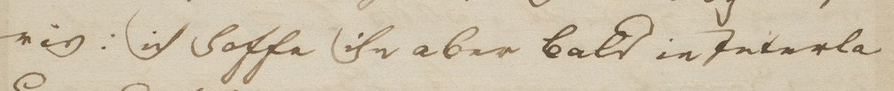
ris: ich hoffe ihn aber bald in Interla-
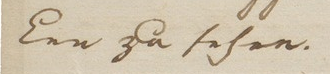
ken zu sehen.
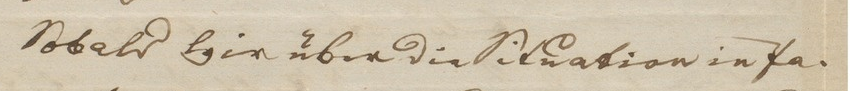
Sobald wir über die Situation in Pa-
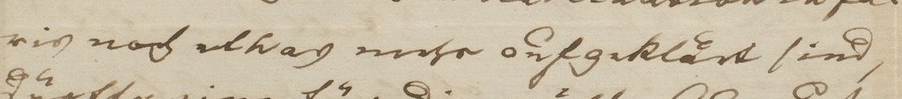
ris noch etwas mehr aufgeklärt sind,
